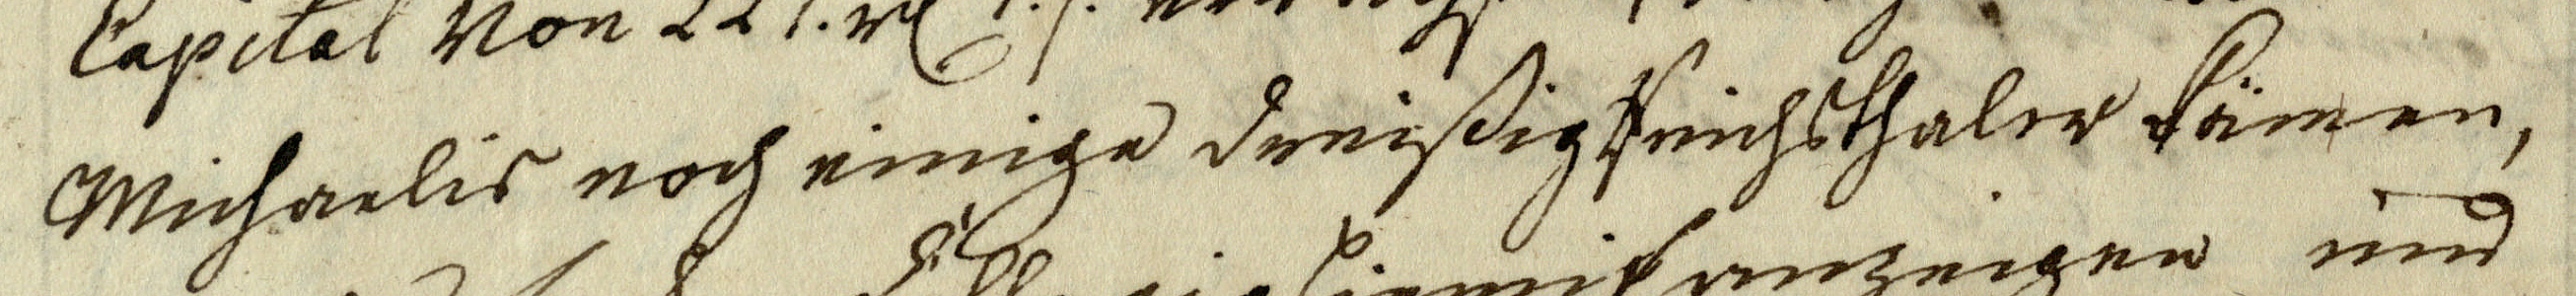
Michaelis noch einige dreißig Reichsthaler kämen,
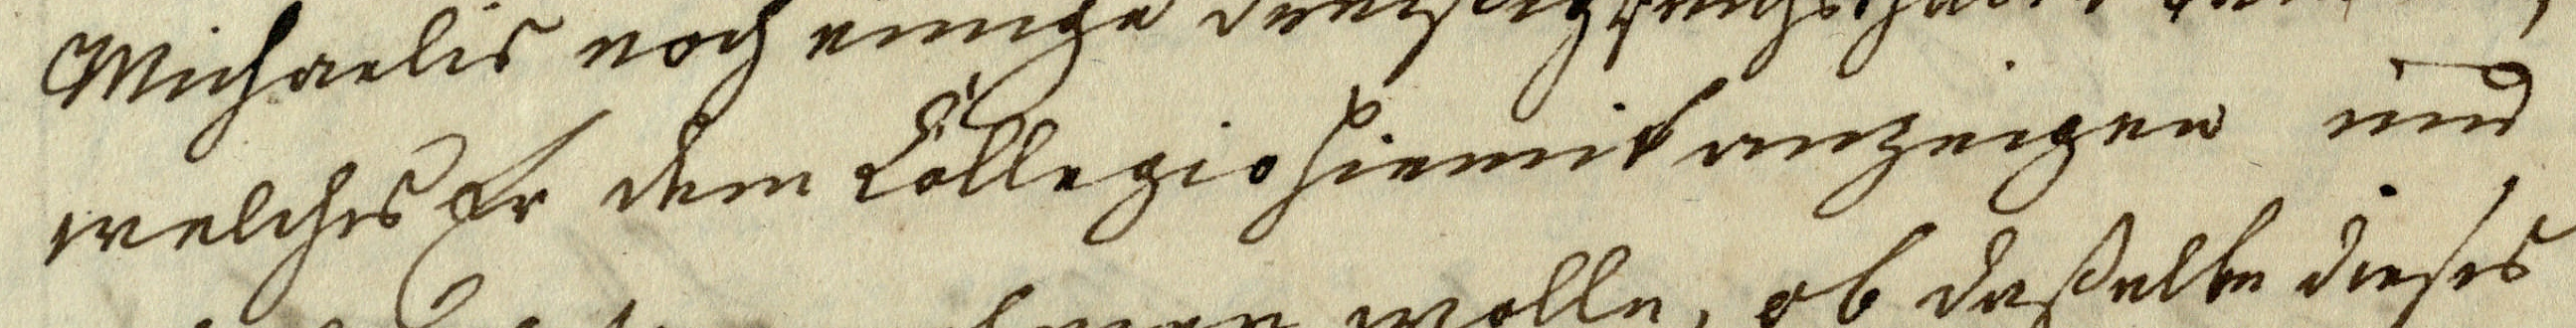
welches Er dem Collegio hiemit anzeigen und
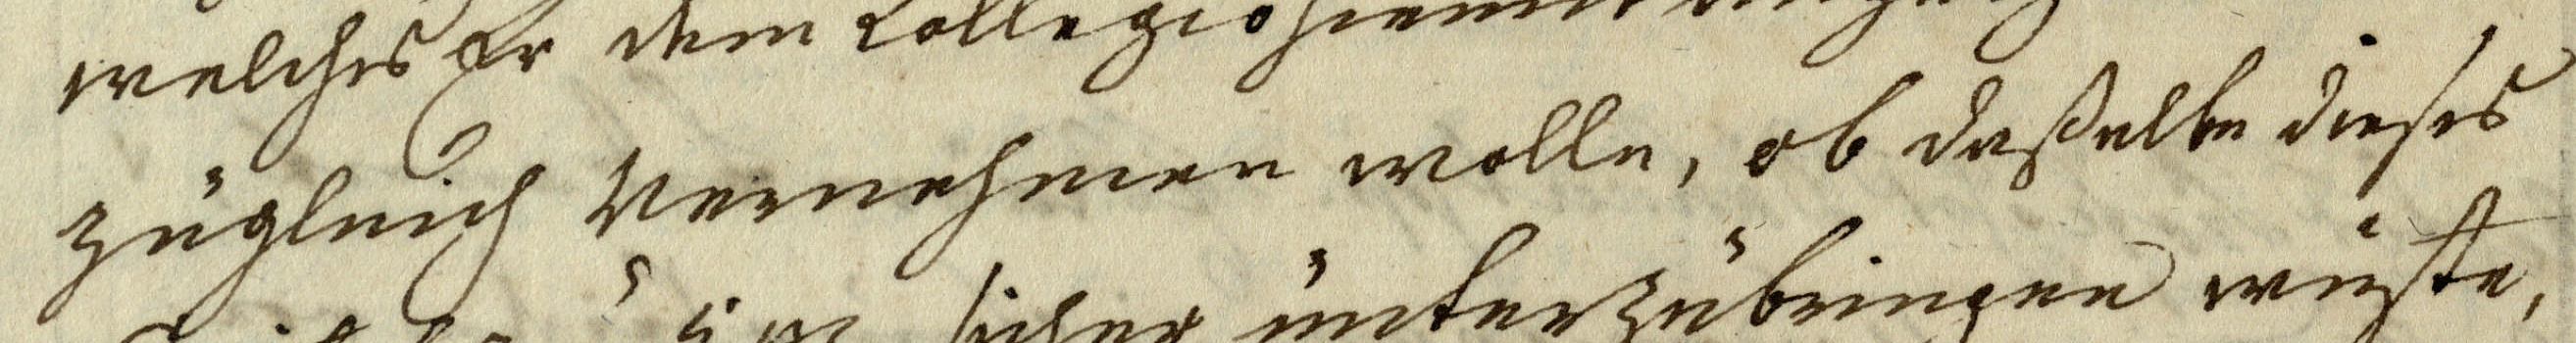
zugleich vernehmen wolle, ob daßelbe dieses
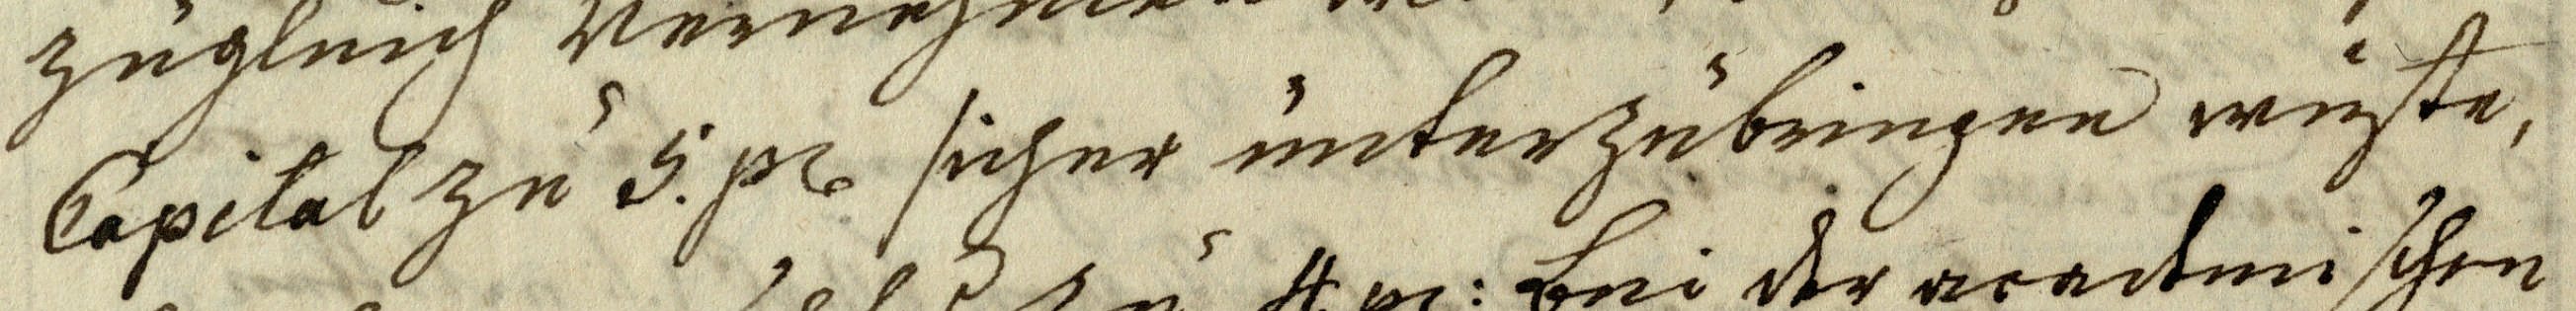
Capital zu 5 p. sicher unterzubringen wüste,
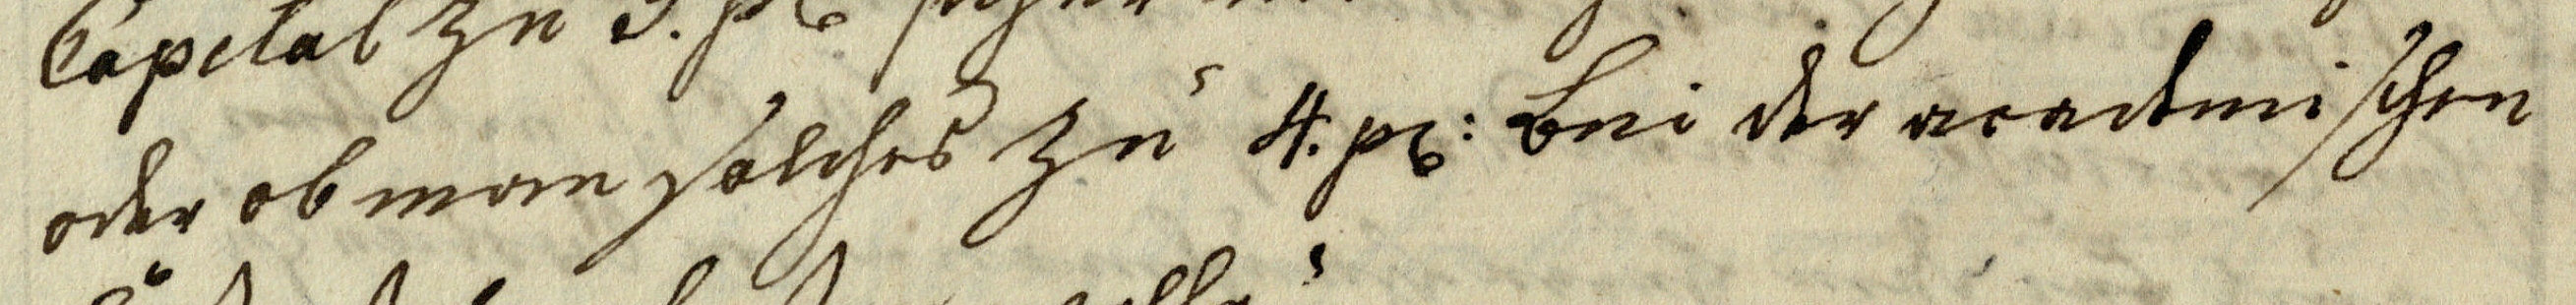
oder ob man solches zu 4. p. bei der academischen
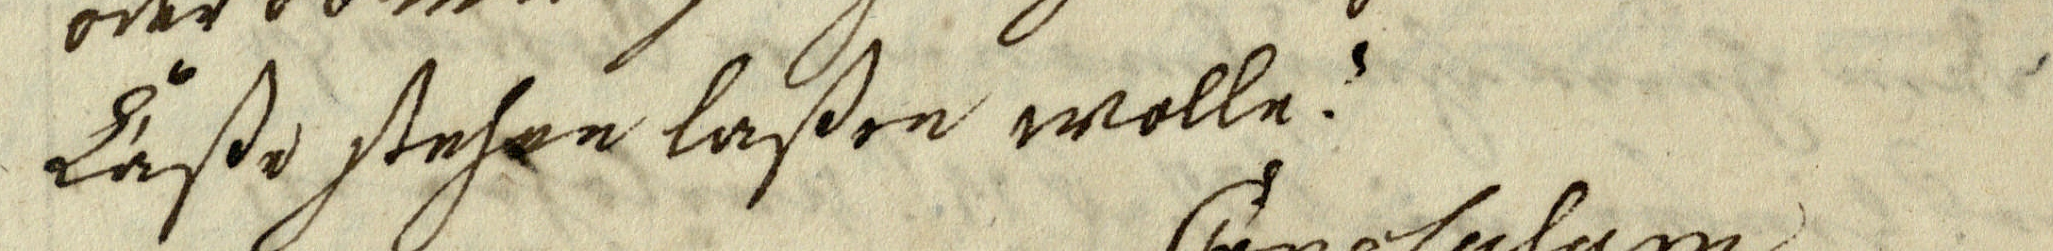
Caße stehen laßen wolle.
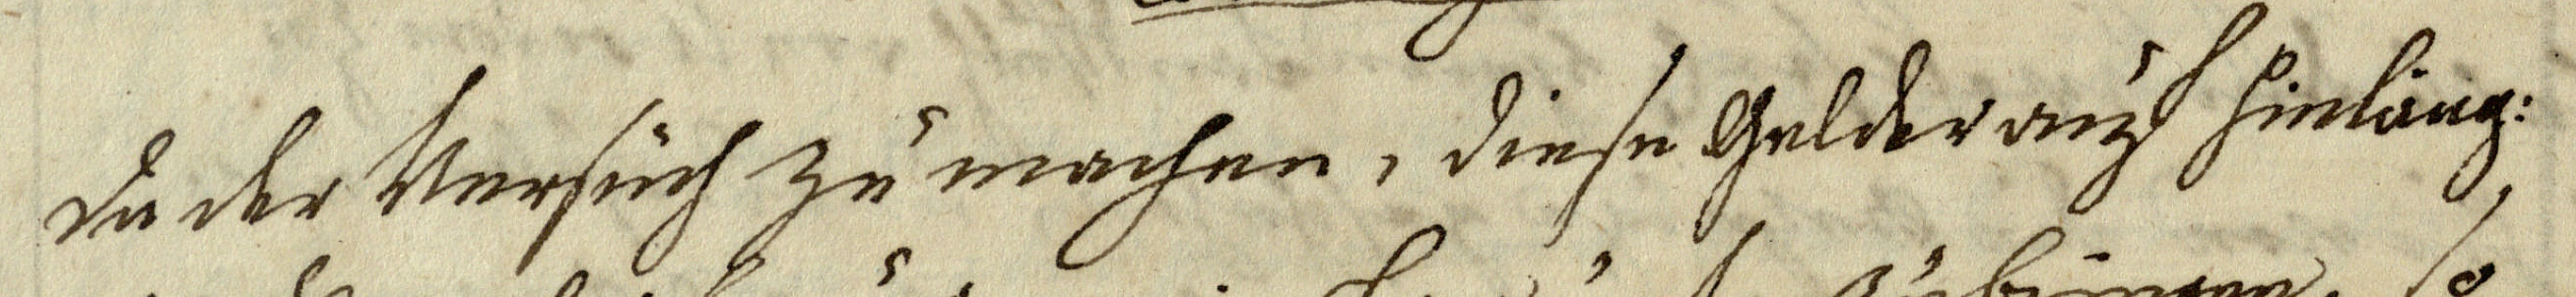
Da der Versuch zu machen, diese Gelder auf hinläng¬
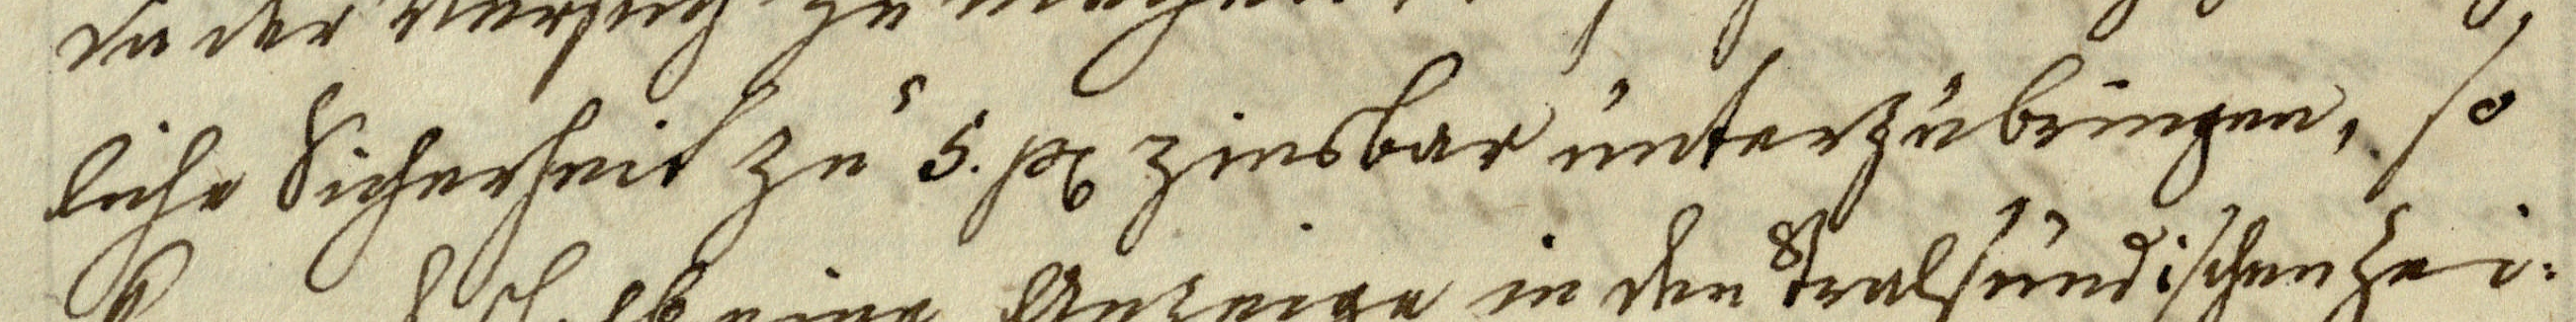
liche Sicherheit zu 5 p. zinsbar unterzubringen, so
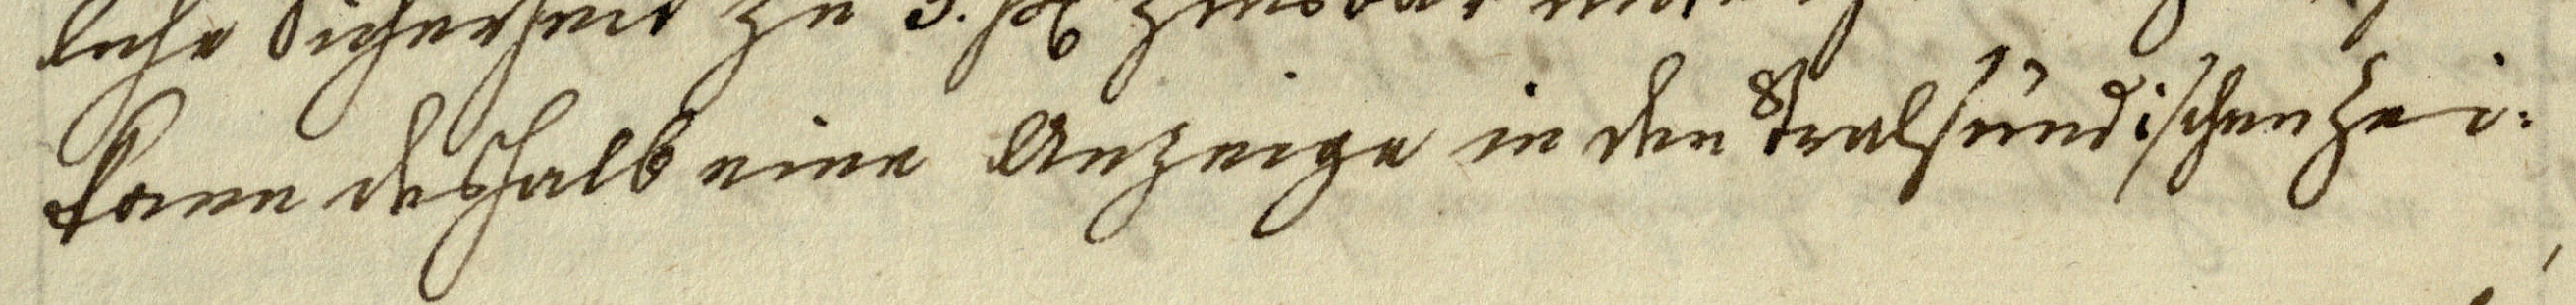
kann deshalb eine Anzeige in der Stralsundischen Zei¬
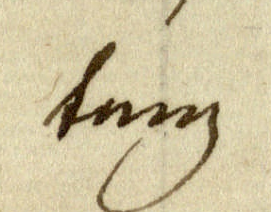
tung
